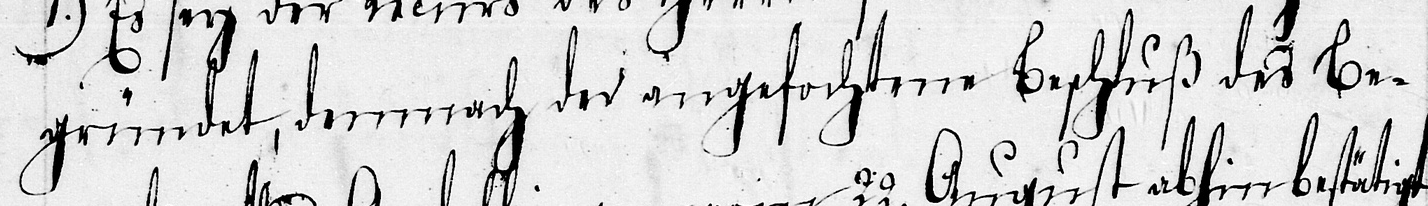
gründet, demnach der angefochtene Beschluß des Be¬
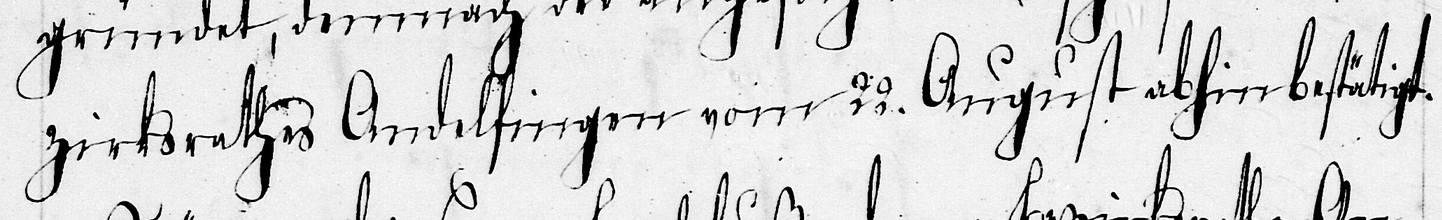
zirksrathes Andelfingen vom 22. August abhin bestätig¬
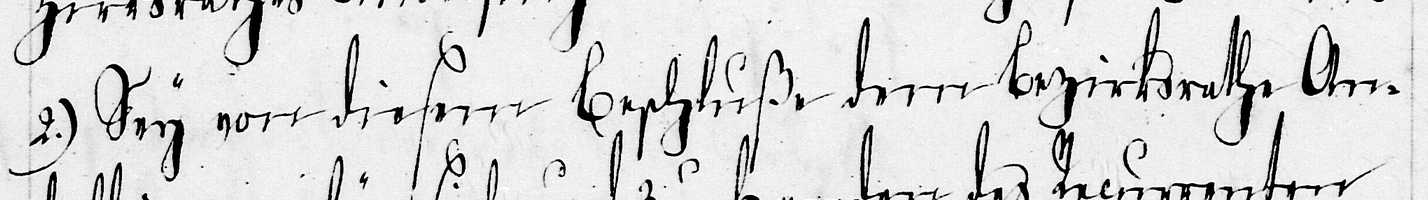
2.) Sey von diesem Beschluße dem Bezirksrathe An¬
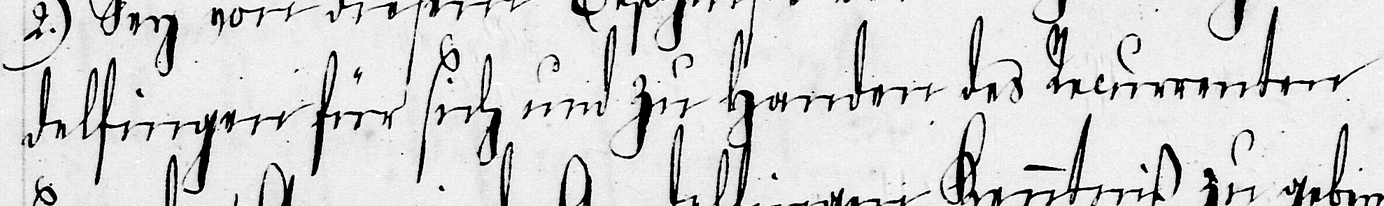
delfingen für sich und zu Handen des Recurrenten
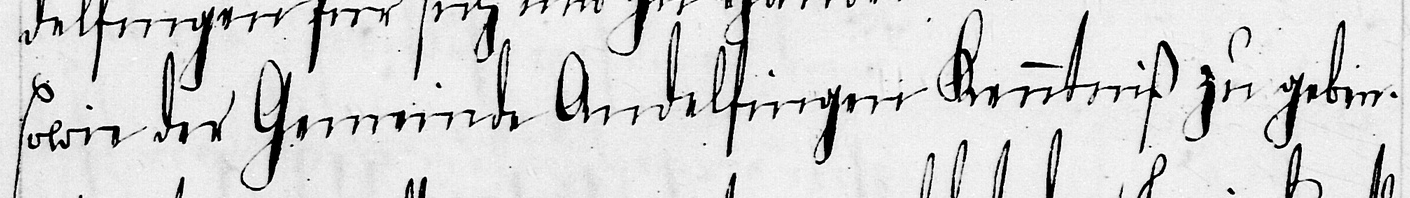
sowie der Gemeinde Andelfingen Kenntniß zu geben.
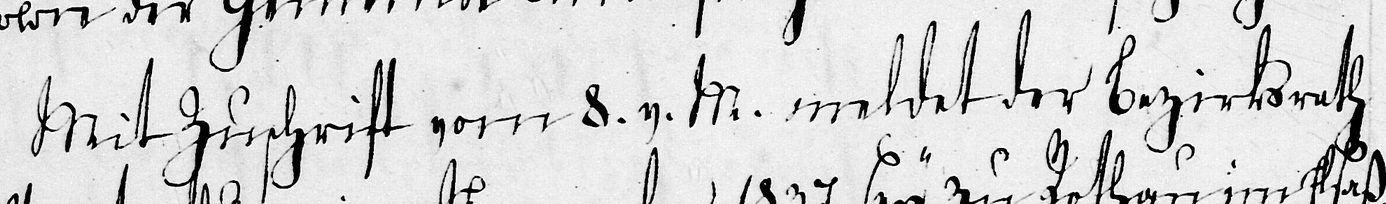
Mit Zuschrift vom 8. v. M. meldet der Bezirksrath
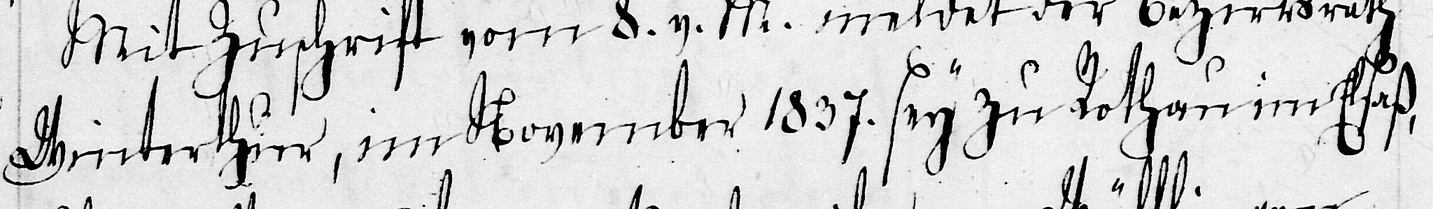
Winterthur, im November 1837. sey zu Rothau im Elsaß,
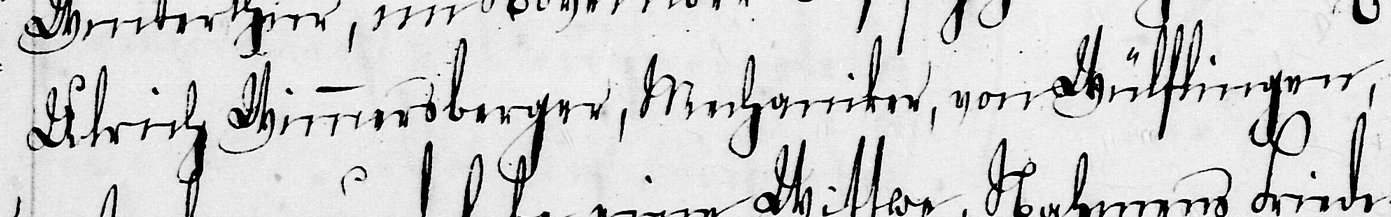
Ulrich Wimmersberger, Mechaniker, von Wülflingen,
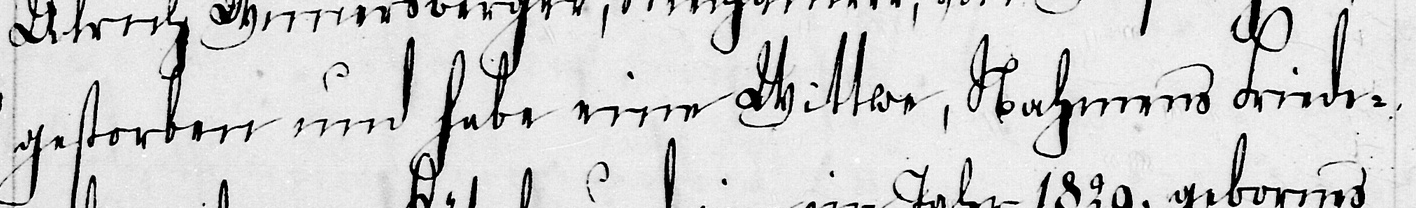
gestorben und habe eine Wittwe, Nahmens Friede¬
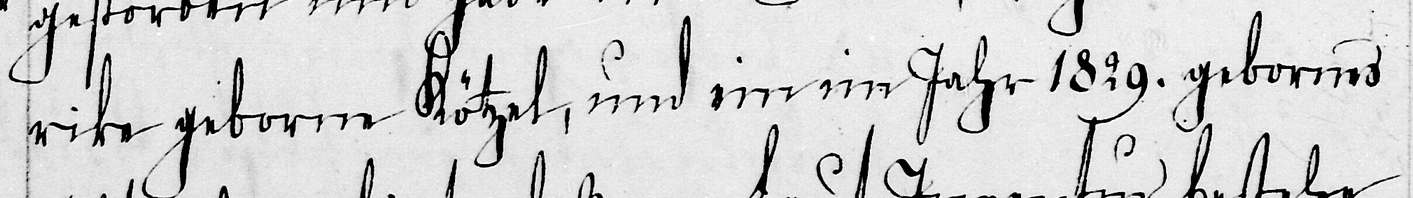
rike geborene Kötzel, und ein im Jahr 1829. gebornes
